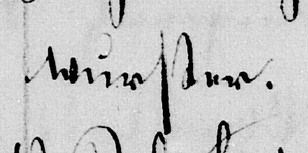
wurster.
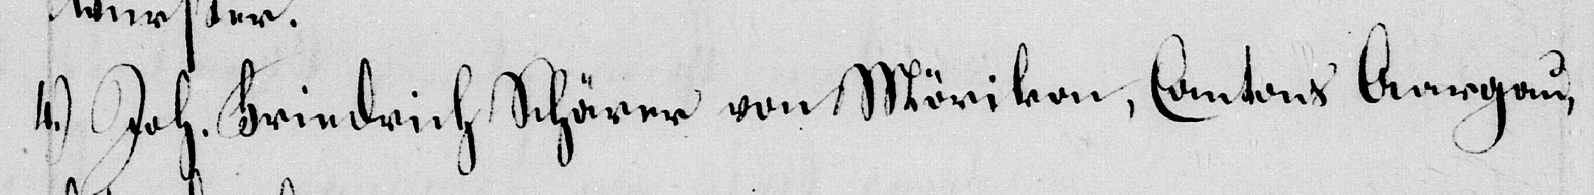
4.) Joh. Friedrich Schärer von Möriken, Cantons Aargau,
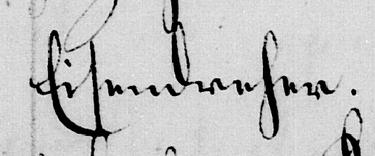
Eisendreher.
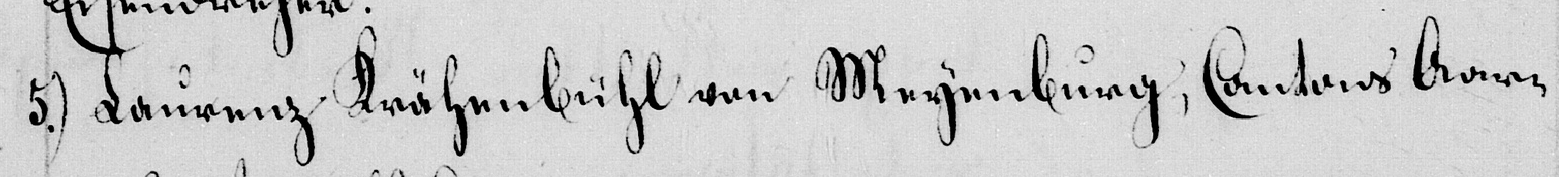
5.) Laurenz Krähenbühl von Meyenburg, Cantons Aar¬
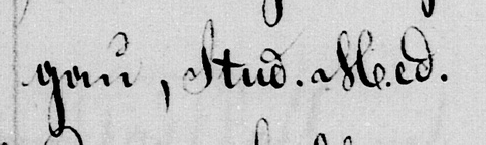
gau, Stud. Med.
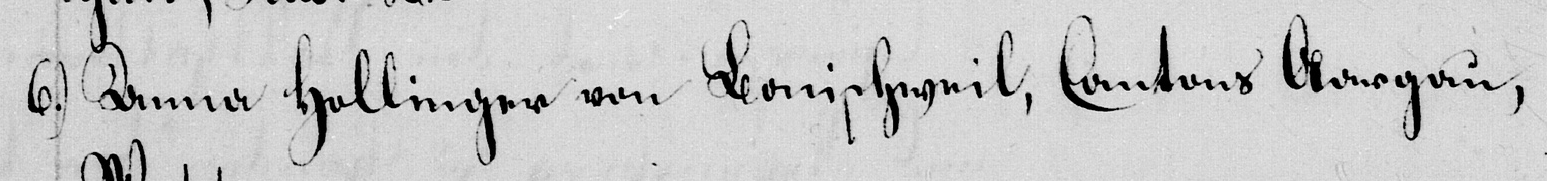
6.) Anna Hollinger von Bonischweil, Cantons Aargau,
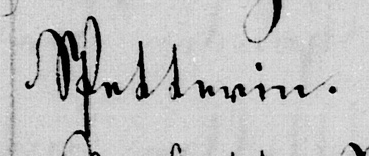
Spetterin.
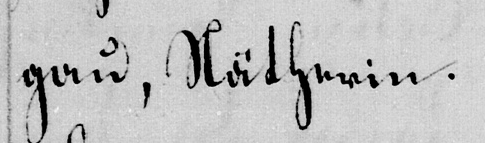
gau, Nätherin.
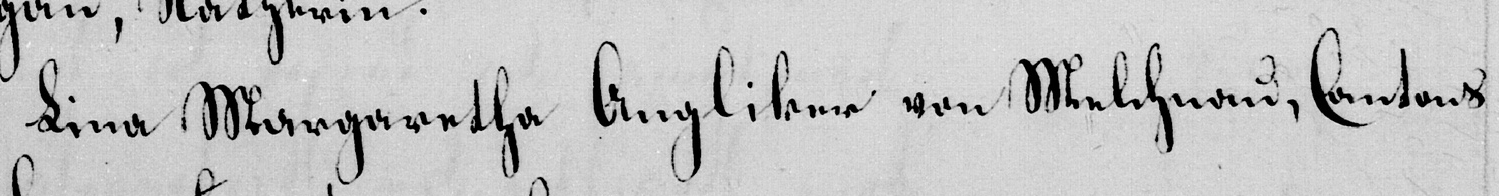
Lina Margaretha Angliker von Melchnau, Cantons
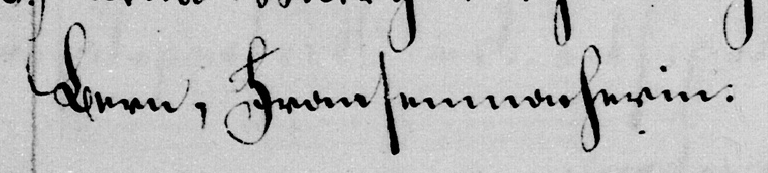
Bern, Fransenmacherin.
